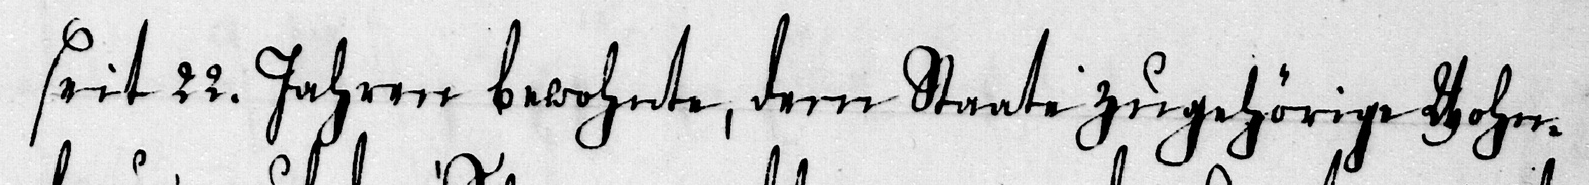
seit 22. Jahren bewohnte, dem Staate zugehörige Wohn¬
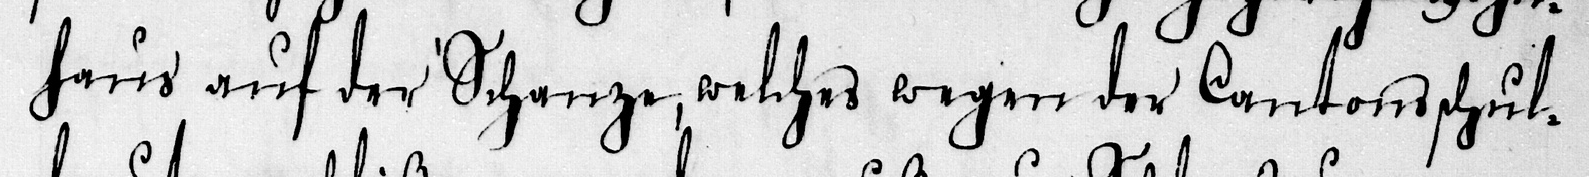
haus auf der Schanze, welches wegen der Cantonsschul¬
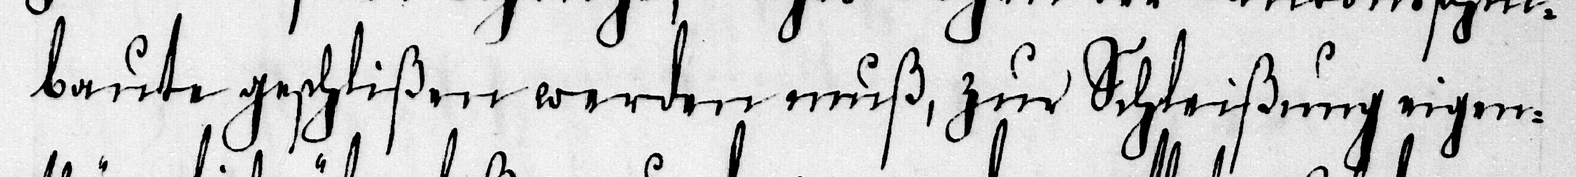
baute geschlißen werden muss, zur Schleißung eigen¬
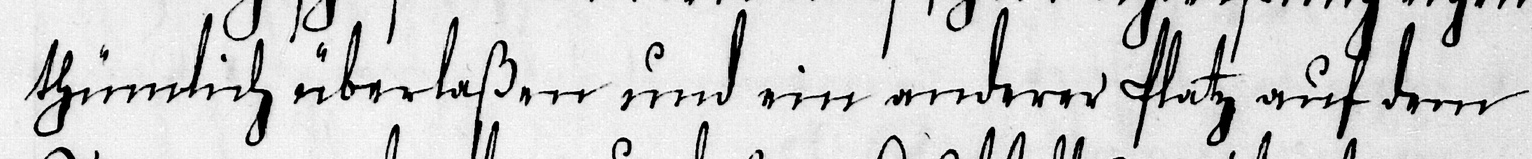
thümlich überlaßen und ein anderer Platz auf dem
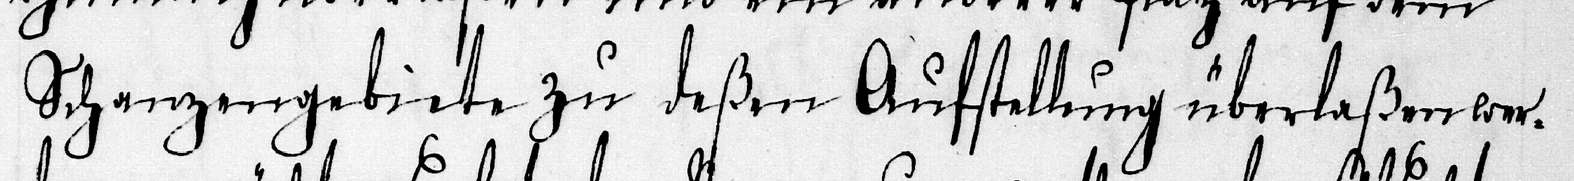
Schanzengebiete zu deßen Aufstellung überlaßen wer¬
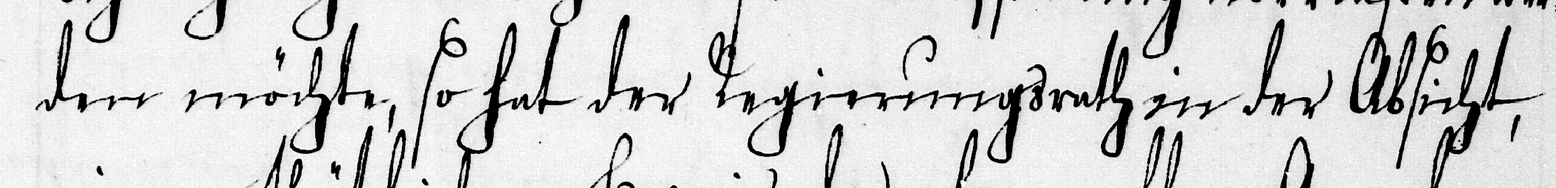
den möchte, so hat der Regierungsrath in der Absicht,
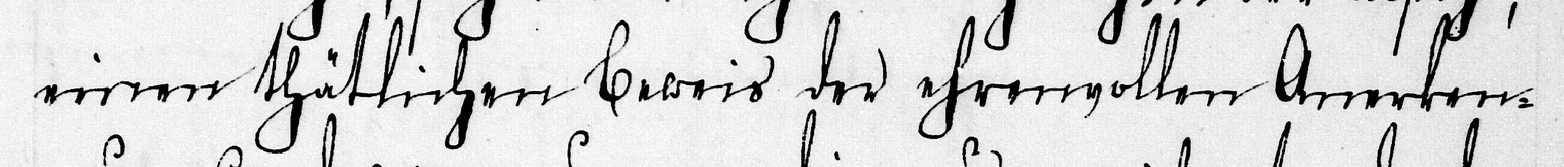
einen thätlichen Beweis der ehrenvollen Anerken¬
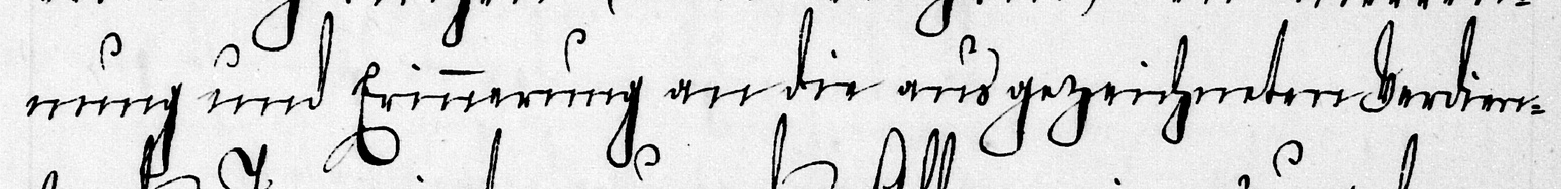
nung und Erinnerung an die ausgezeichneten Verdien¬
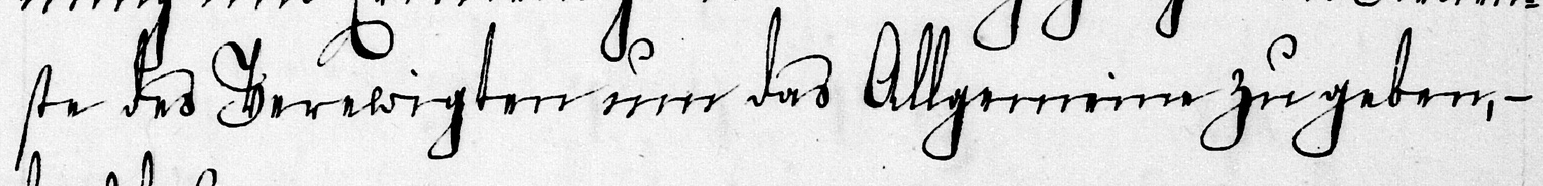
ste des Verewigten um das Allgemeine zu geben, –
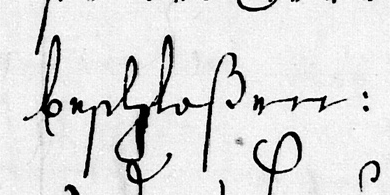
beschloßen:
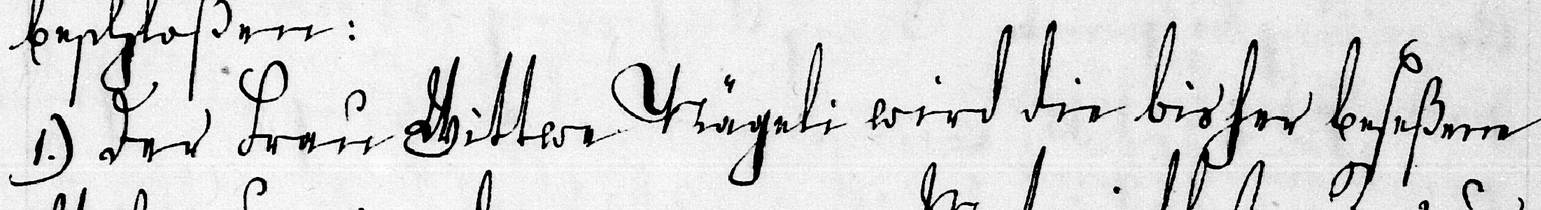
1.) Der Frau Wittwe Nägeli wird die bisher beseßene
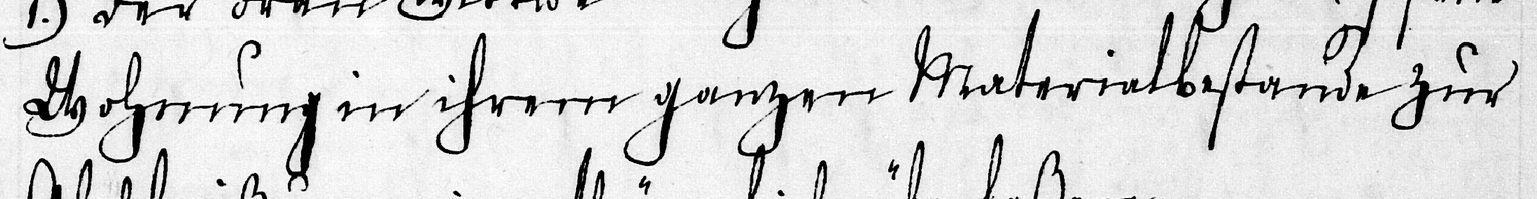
Wohnung in ihrem ganzen Materialbestande zur
